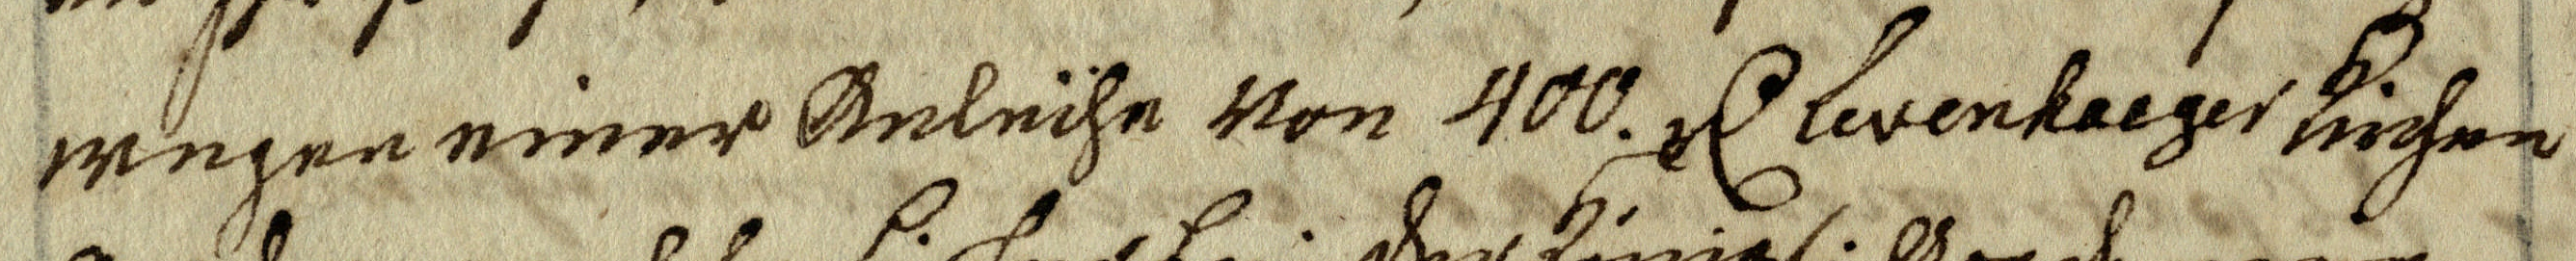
wegen einer Anleihe von 400. rt. Levenhaeger Kirchen
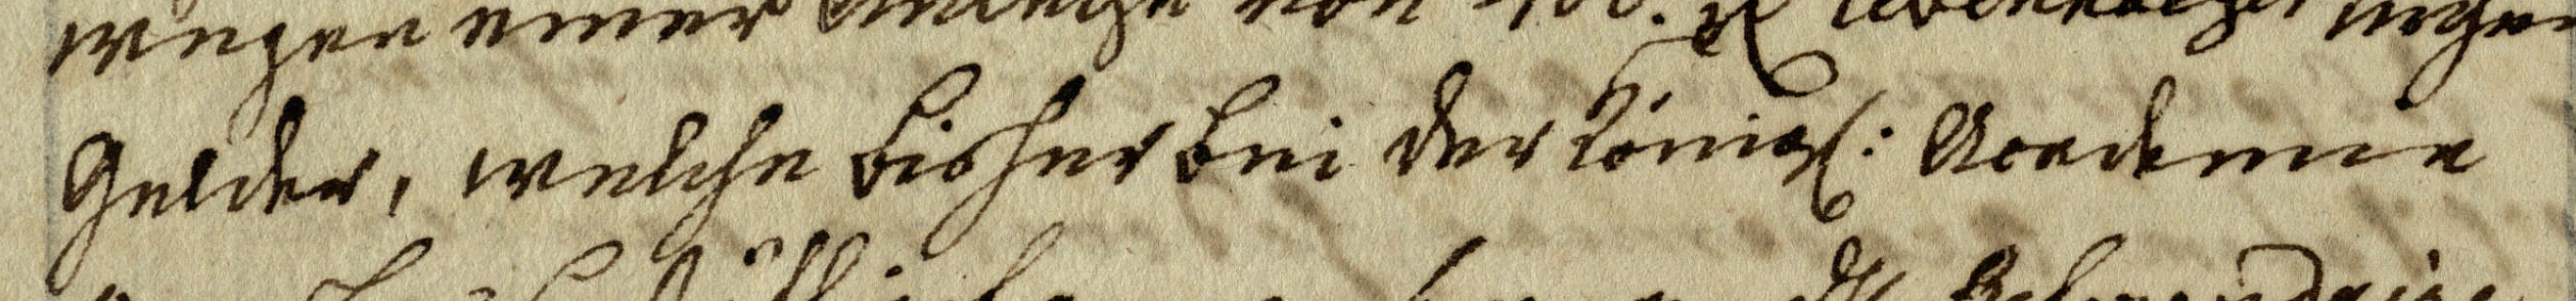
Gelder, welche bisher bei der Königl. Academie
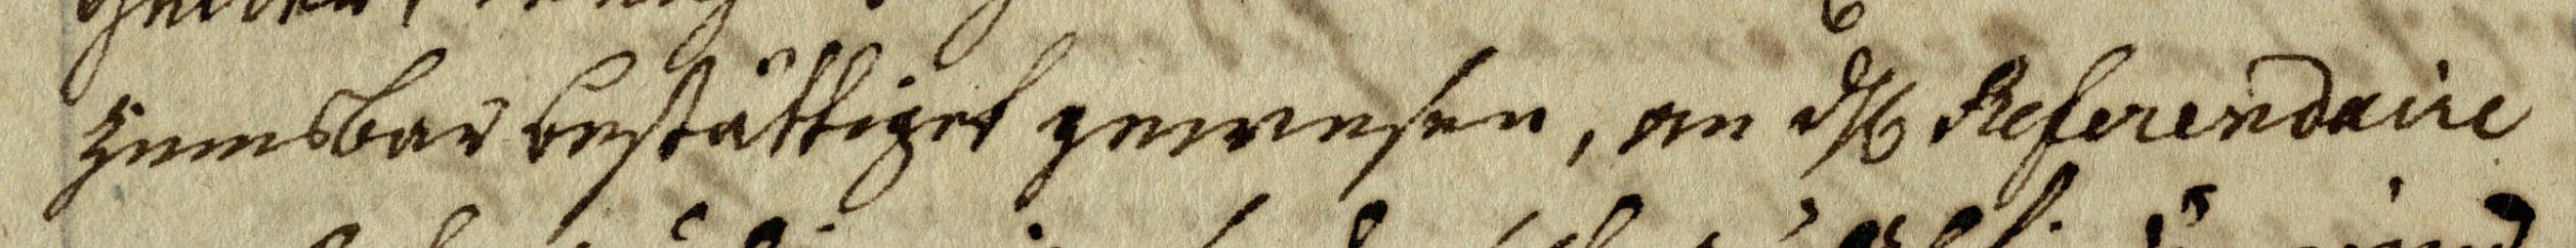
zinnsbar bestättiget gewesen, an dh Referendaire
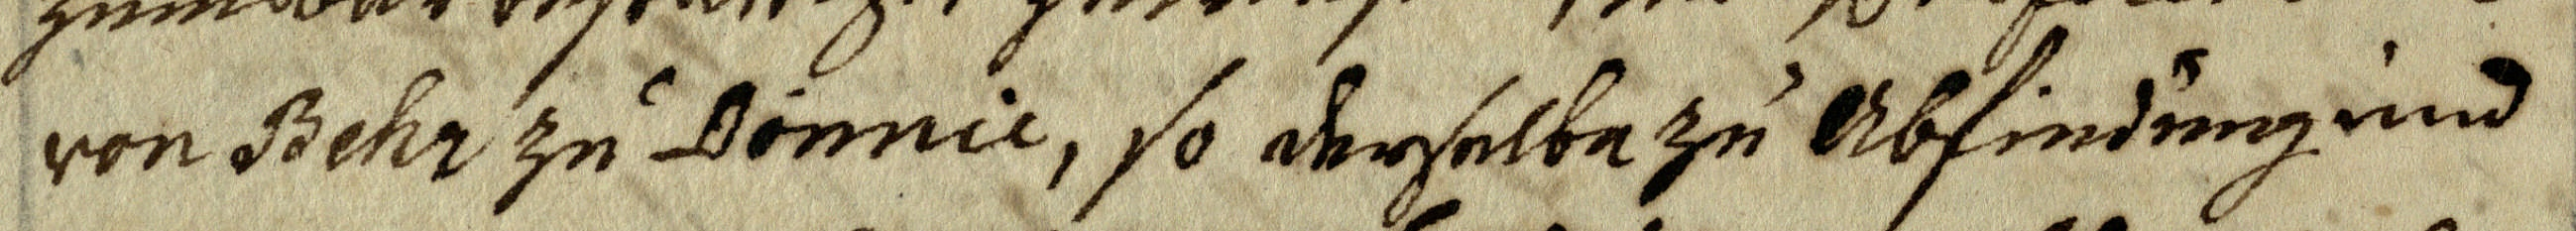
von Behr zu Dönnie, so derselbe zu Abfindung und
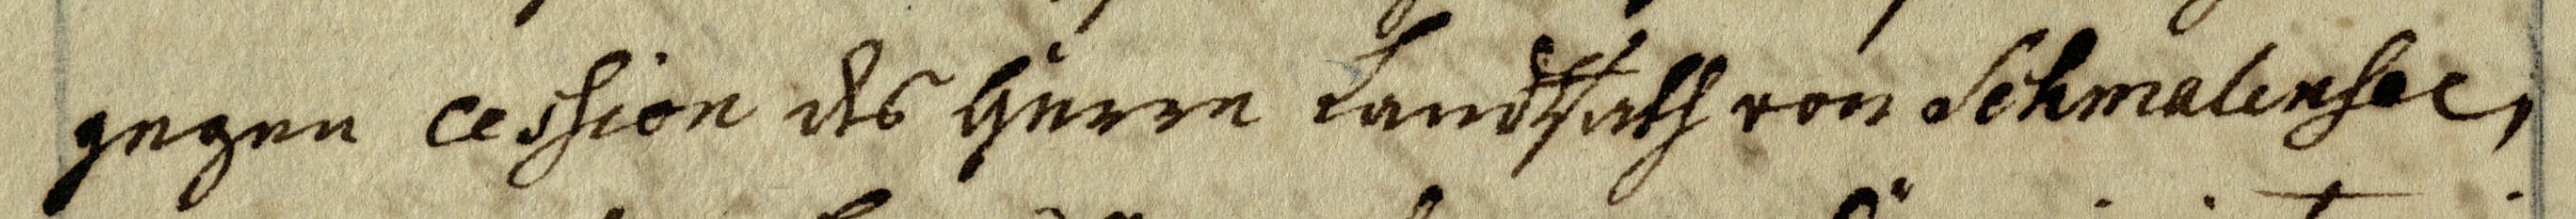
gegen cession des Herrn LandRath von Schmalensee,
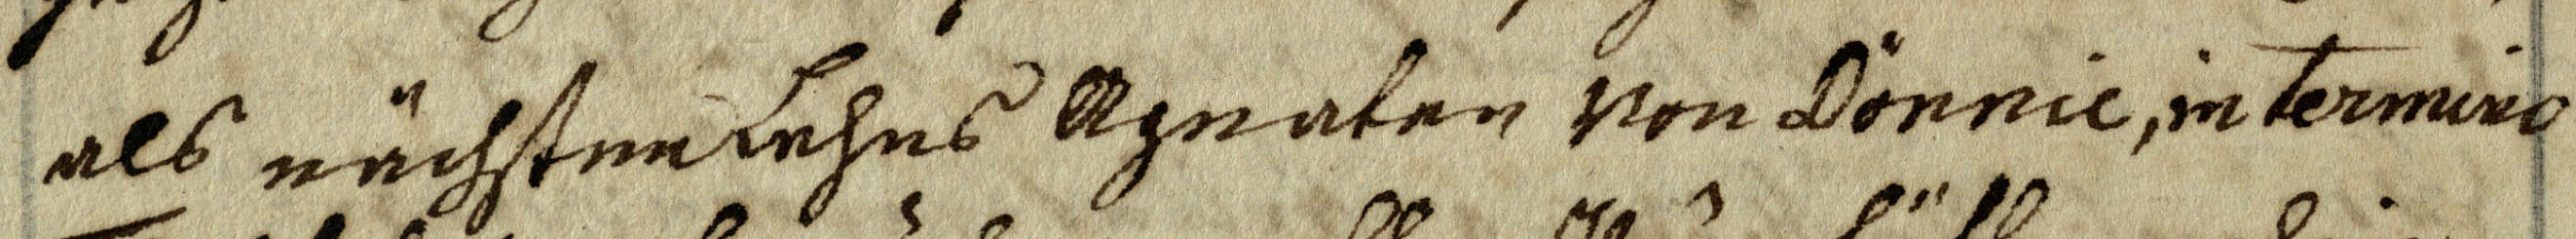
als nächsten Lehns Agnaten von Dönnie, in termino
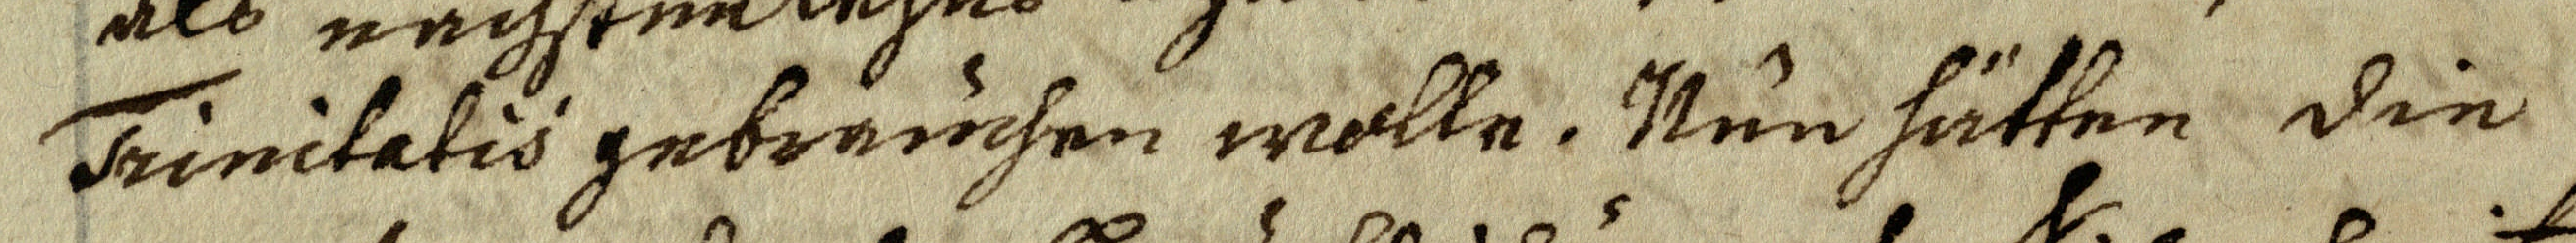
Trinitatis gebrauchen wolle. Nun hätten die
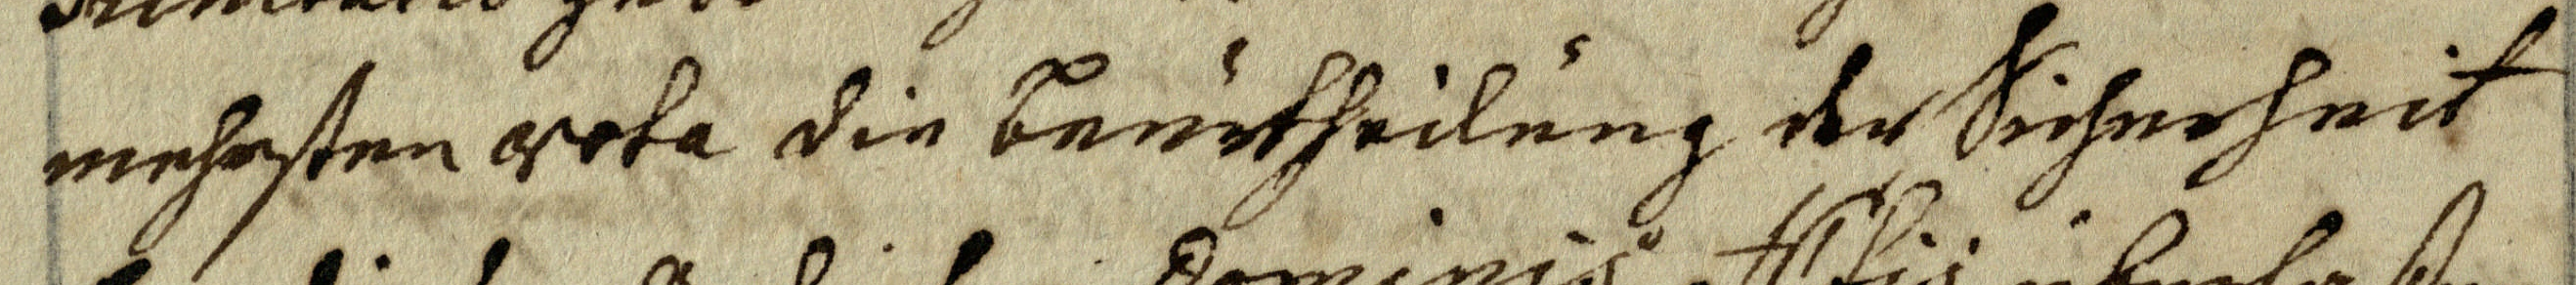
mehrsten vota die Beurtheilung der Sicherheit
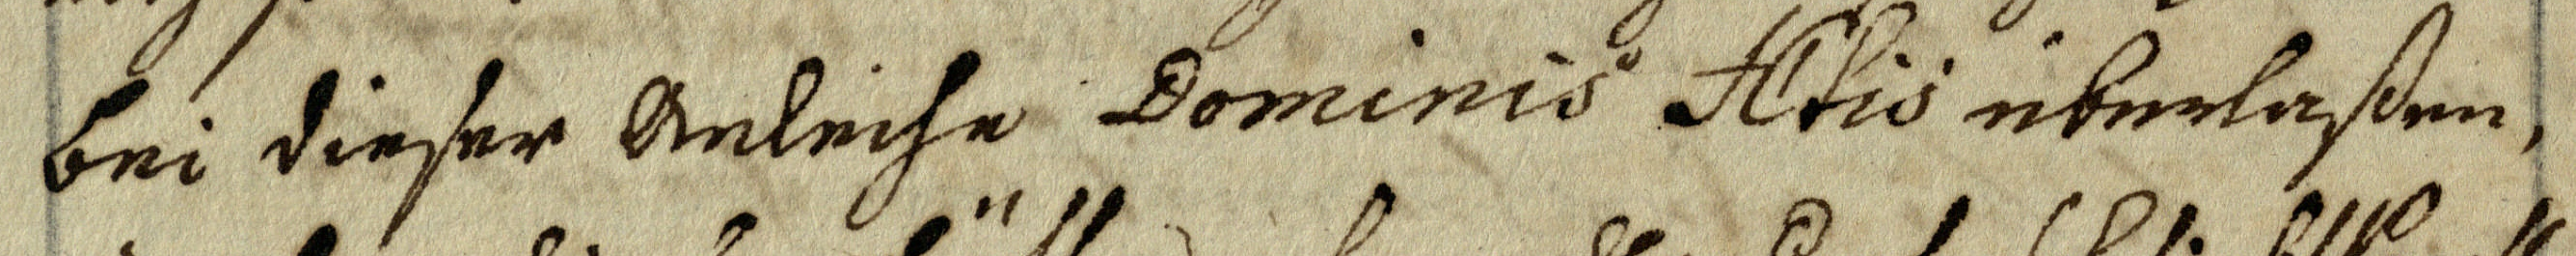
bei dieser Anleihe Dominis Actis überlaßen,
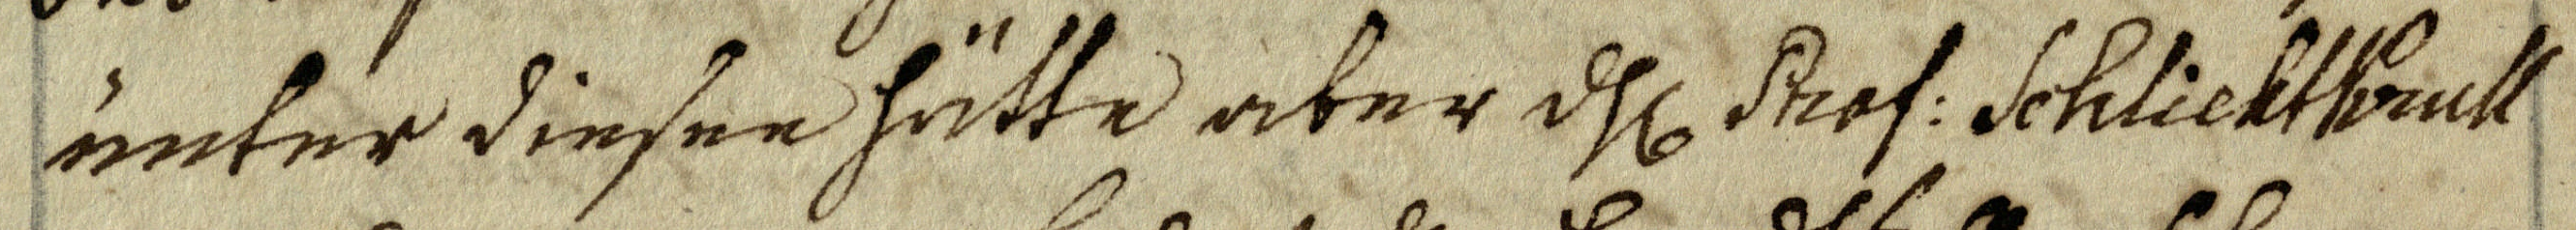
unter diesen hätte aber dh Prof. Schlichtkrull
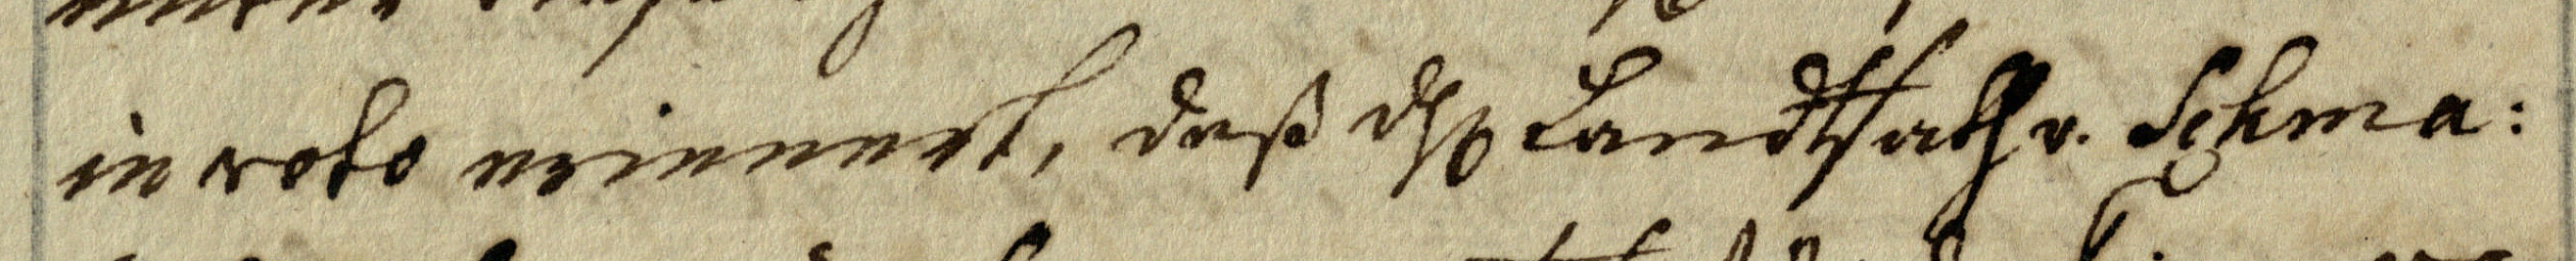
in voto erinnert, daß dh LandRath v. Schma¬
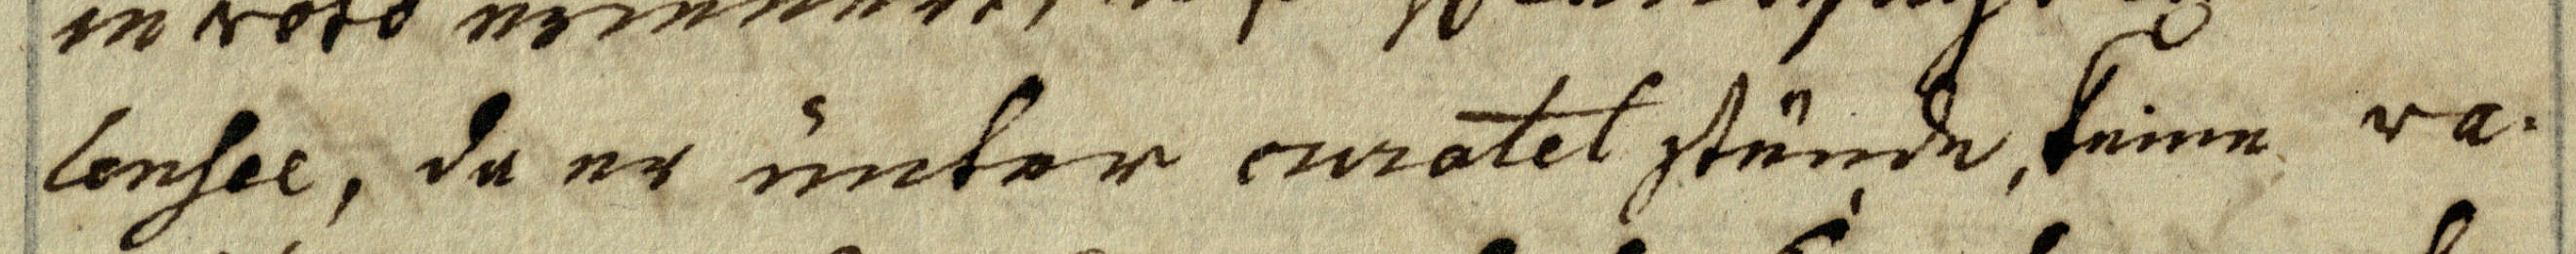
lensee, da er unter curatel stünde, keine va¬
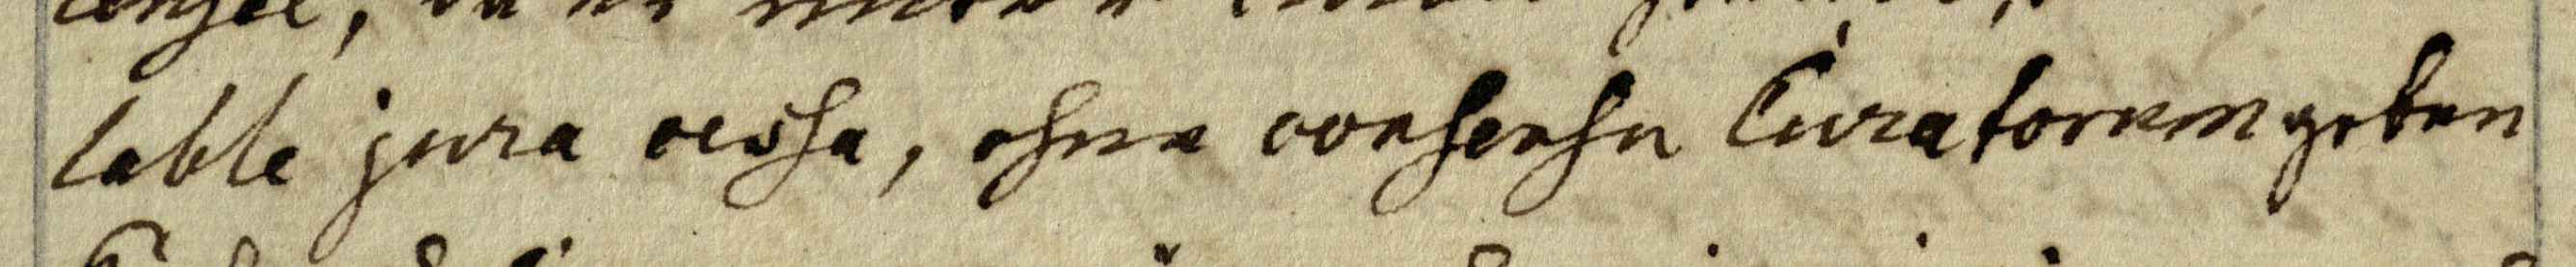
table jura cessa, ohne consense Curatorem geben
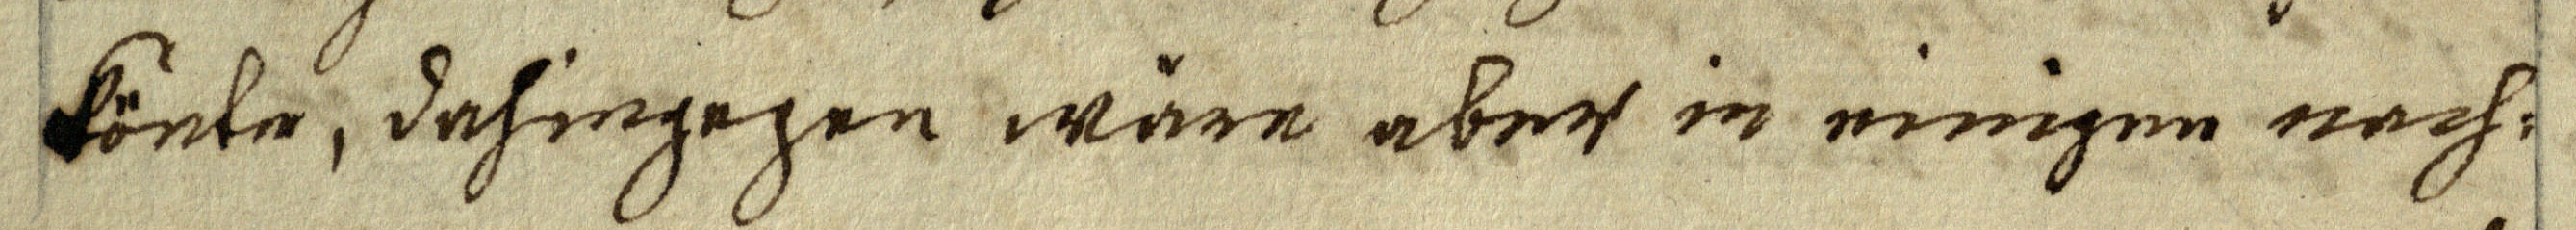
könte, dahingegen wäre aber in einigen nach¬
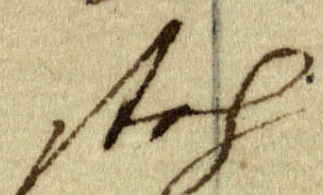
steh
